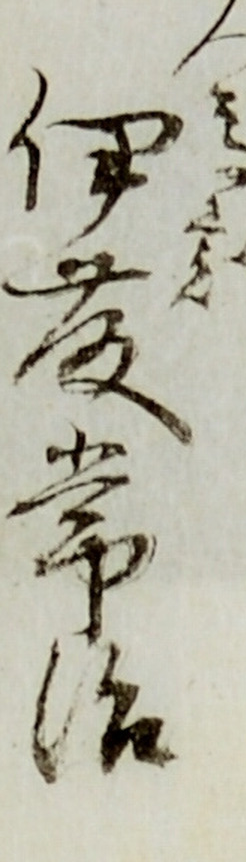伊藤常治
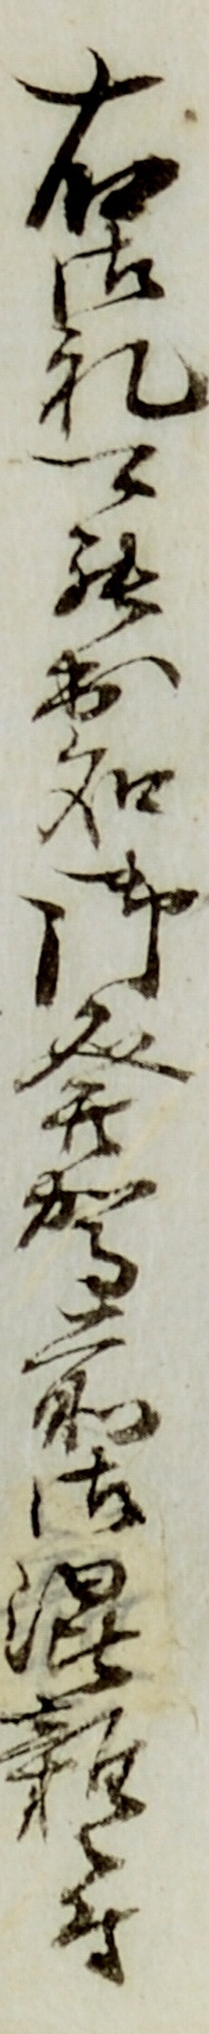右御礼可罷出処御発駕前御混雑に付
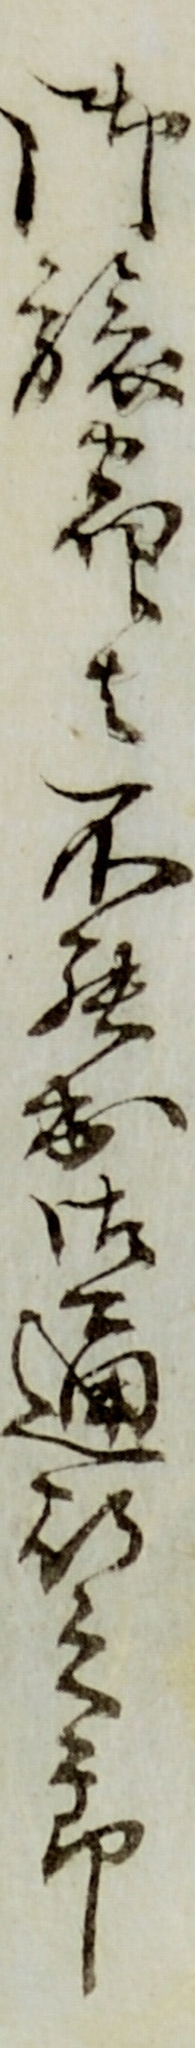御旅宿えは不罷出御通行之節

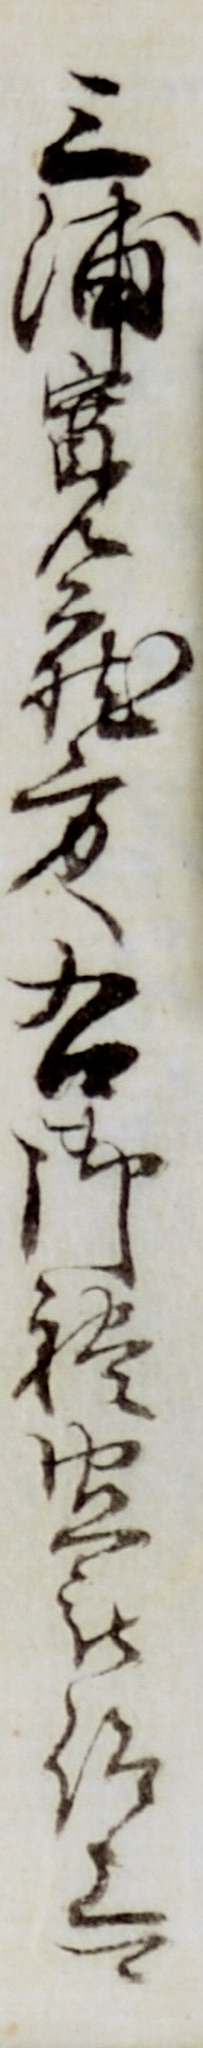三浦寛蔵方へ右御礼宜被仰上可
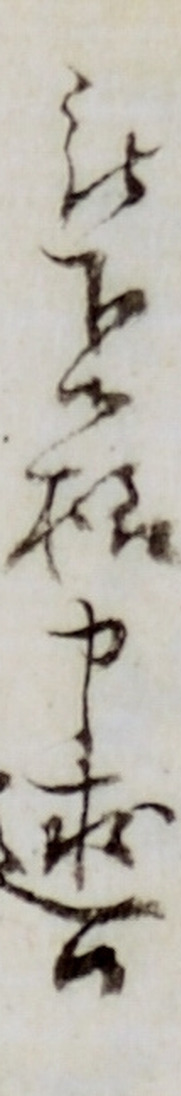被下候様申述候
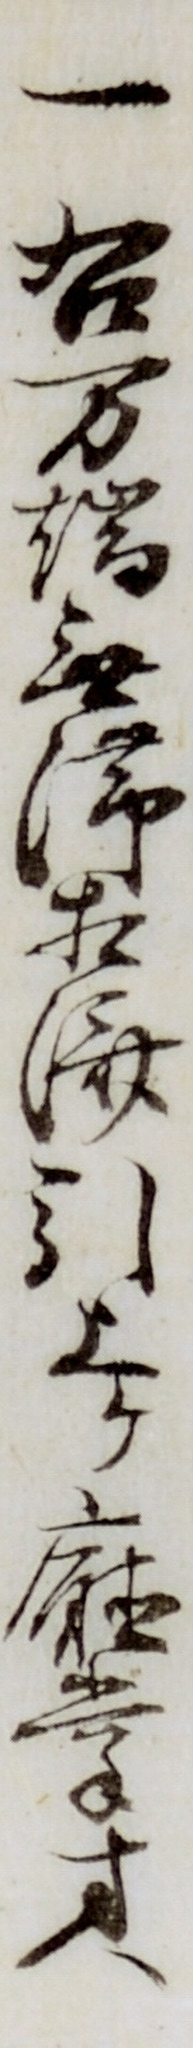一右万端無滞相済引上ケ庁掌方へ
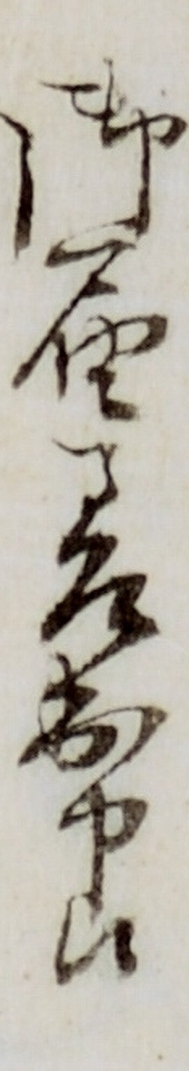御届差出申候
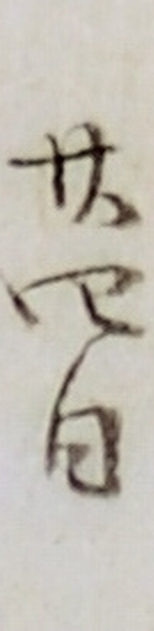廿四日
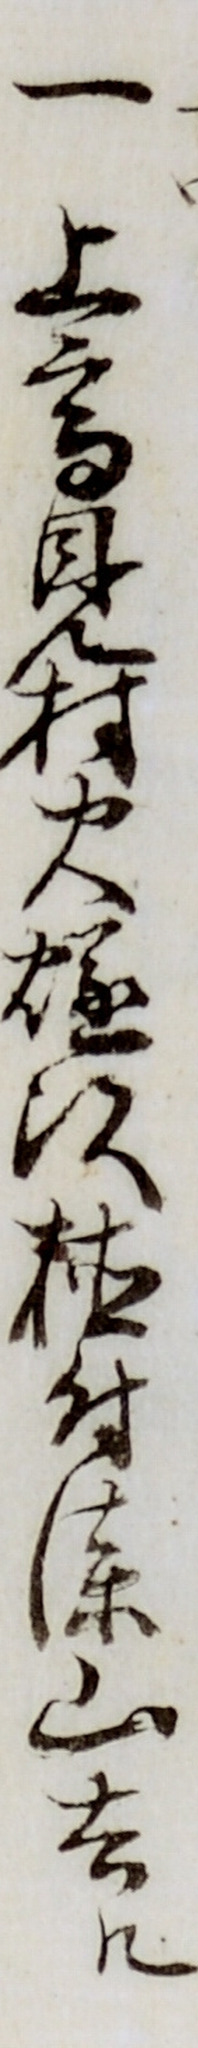一上高見村火燧沢植付漆山去ル
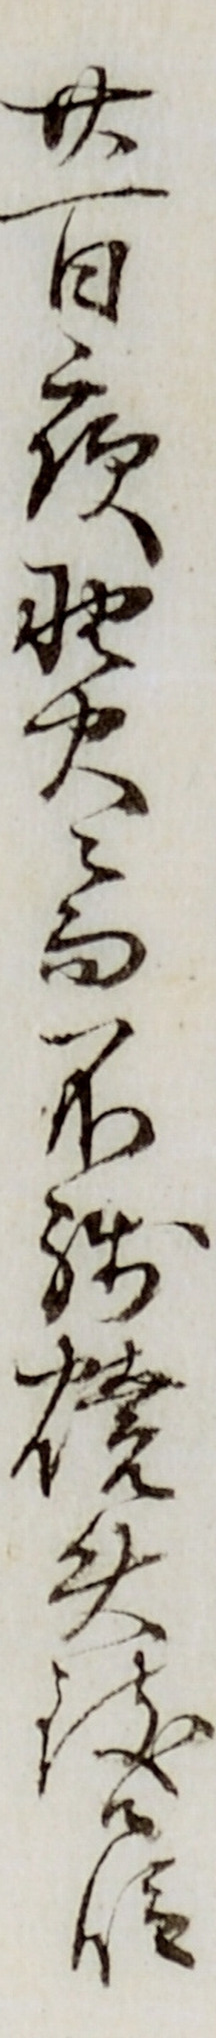廿一日夜野火にて不残焼失致候段
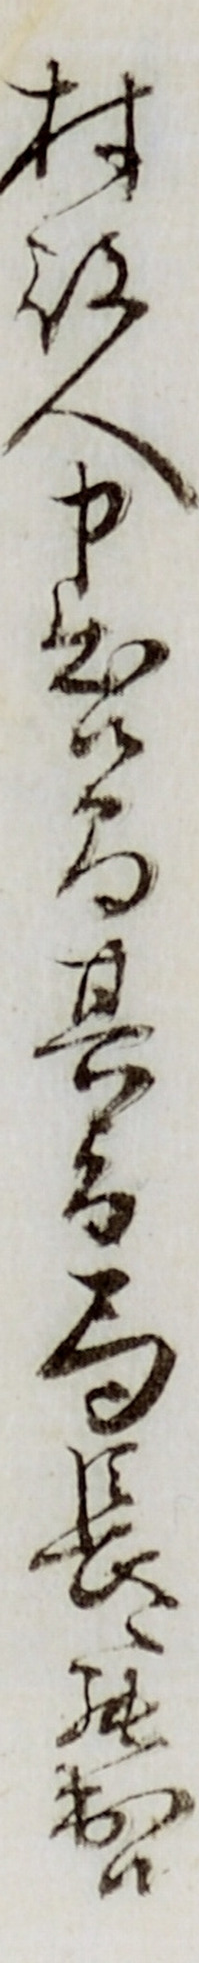村役人申出候間其旨局長へ罷出候
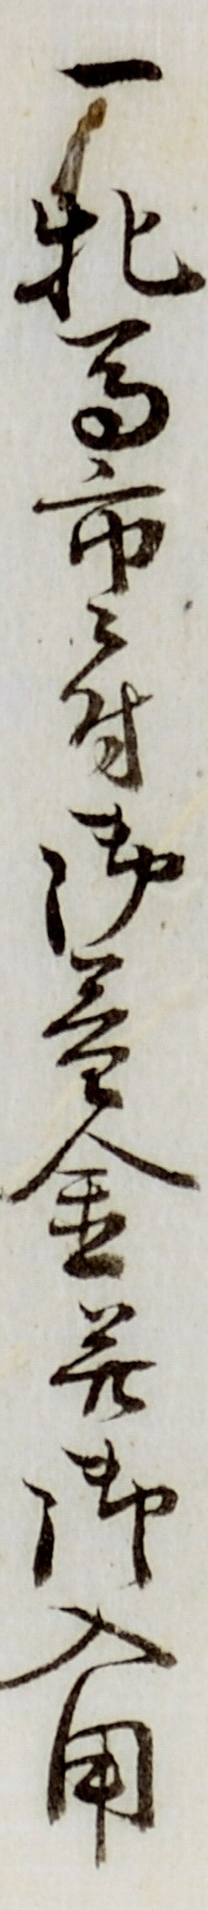一牝馬市に付御益金幷御入用
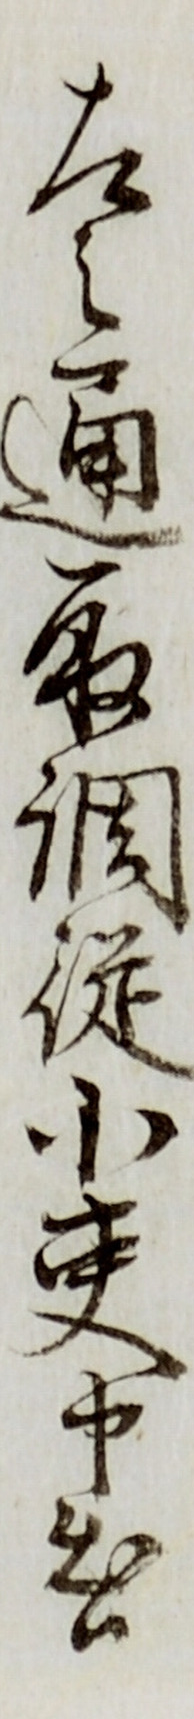左之通取調従小吏申出候
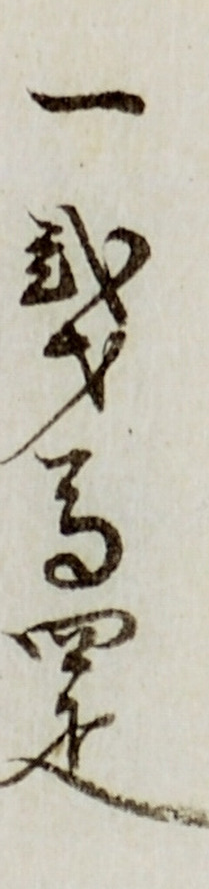一弐才馬四疋
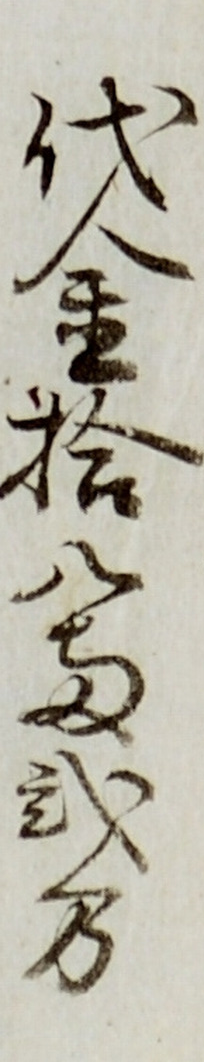代金拾八両弐分
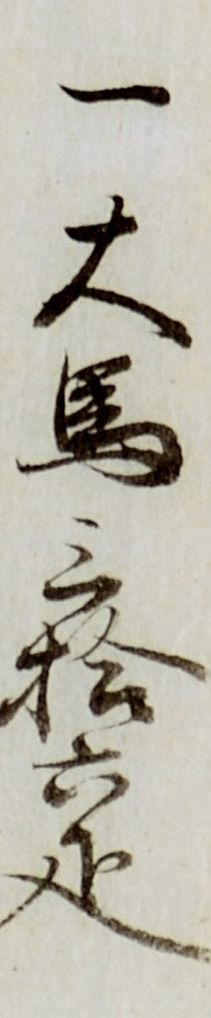一大馬三拾六疋
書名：山林方諸事御用留
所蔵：伊那市立高遠町図書館・合同会社AMANE
